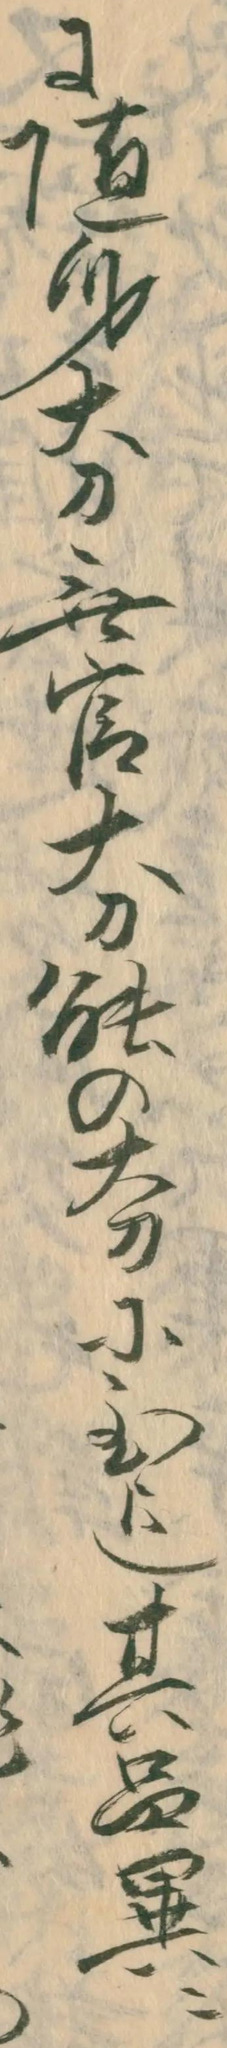に随身大刀無官大刀能の大刀に至迄其品異に
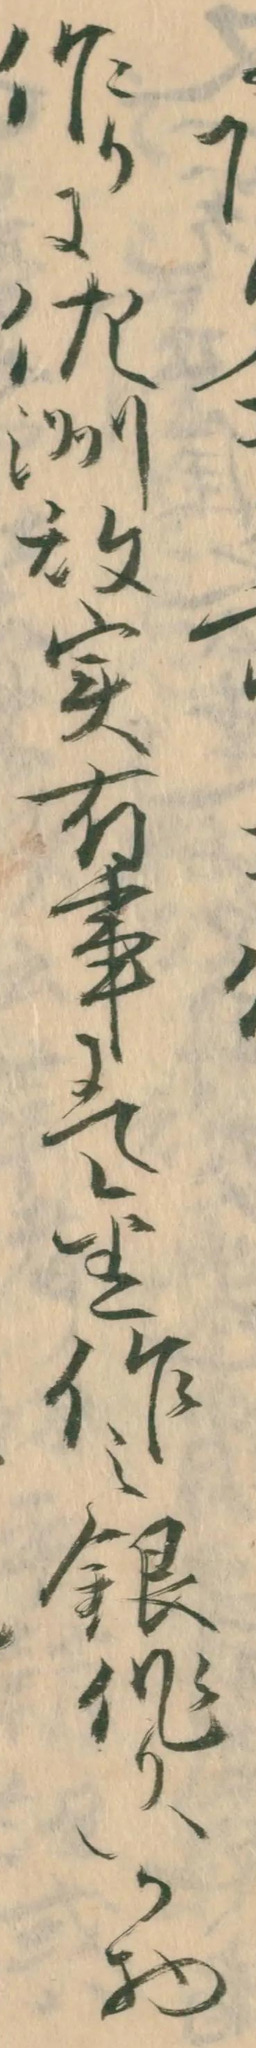作りに佐洲故実有事にて金作之銀作りいか物
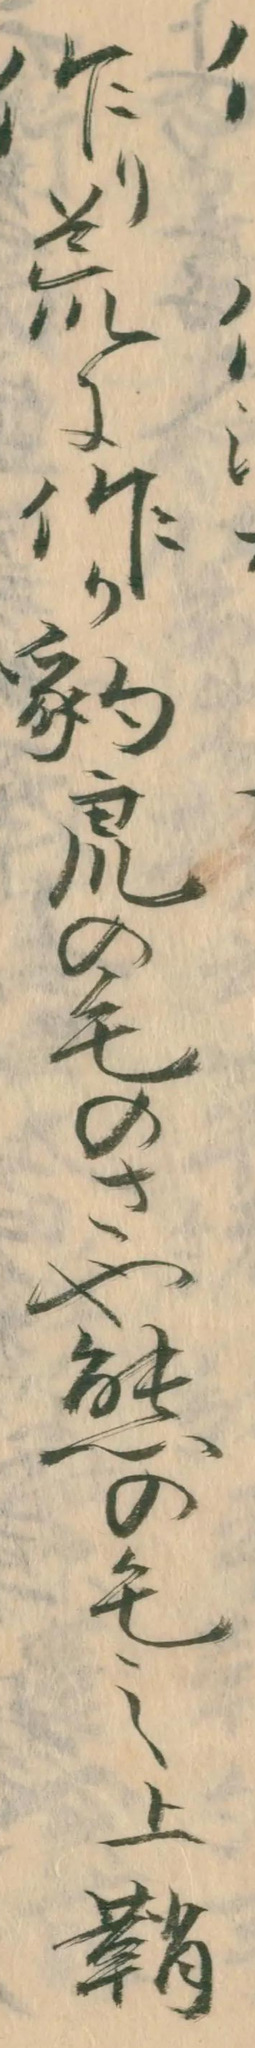作り荒に作り豹虎の毛のさや熊の毛之上鞘
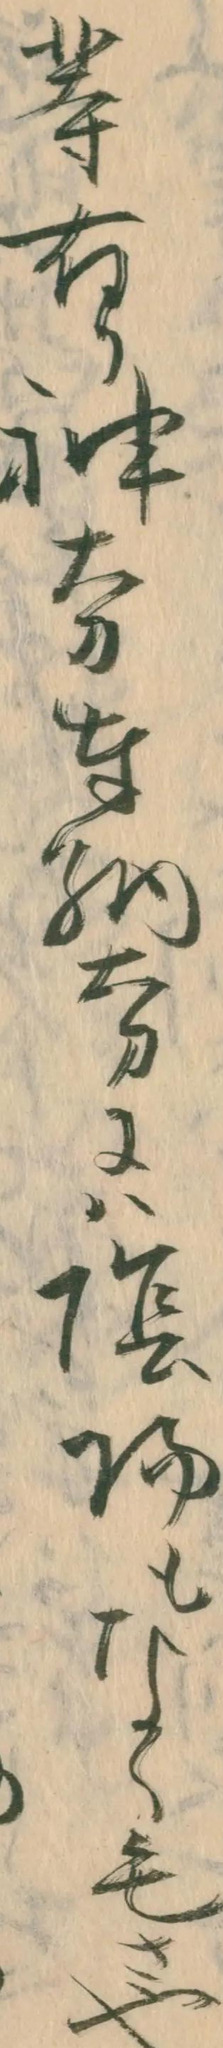等有り神大刀奉納大刀には陰陽もなく毛さや
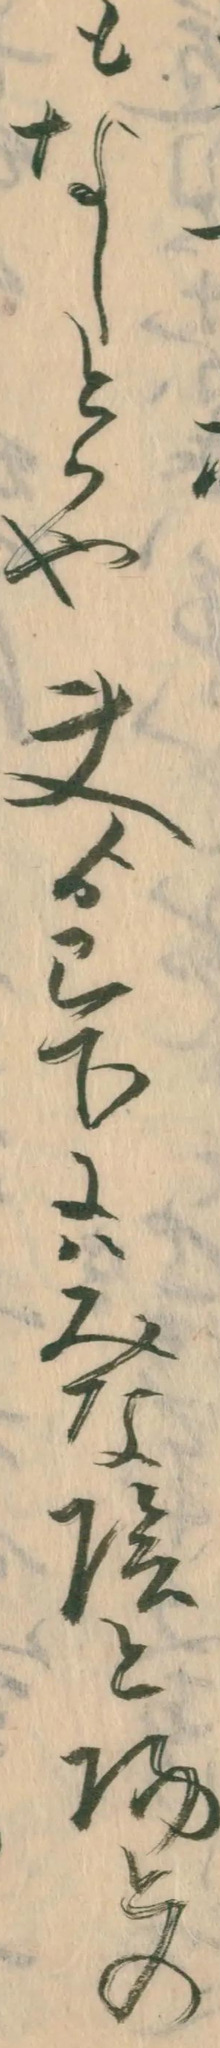もなしとかや夫ゟ已下にはみな陰と陽との
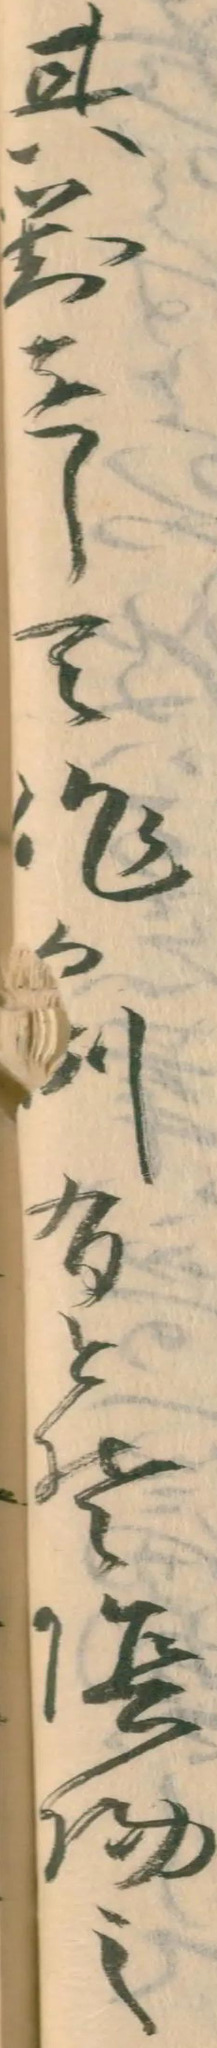其対をして作る有とそ陰陽之
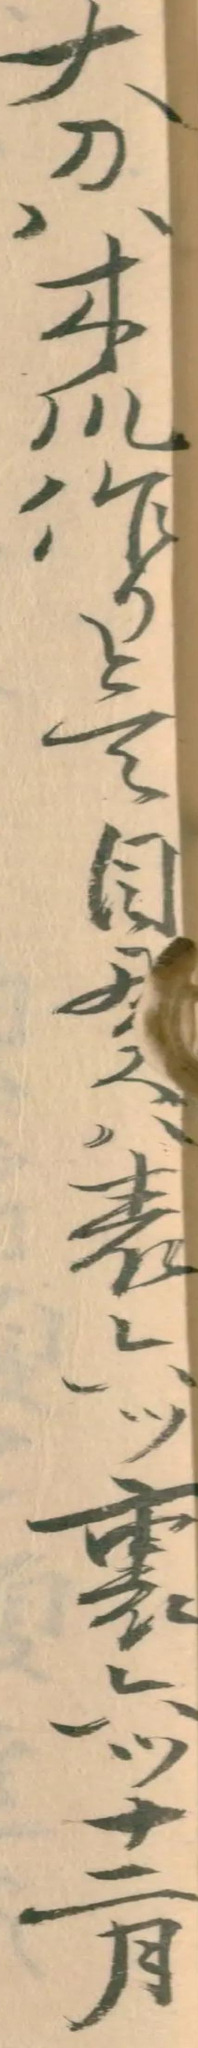大刀は木爪作りとて目貫は表六つ裏六つ十二月
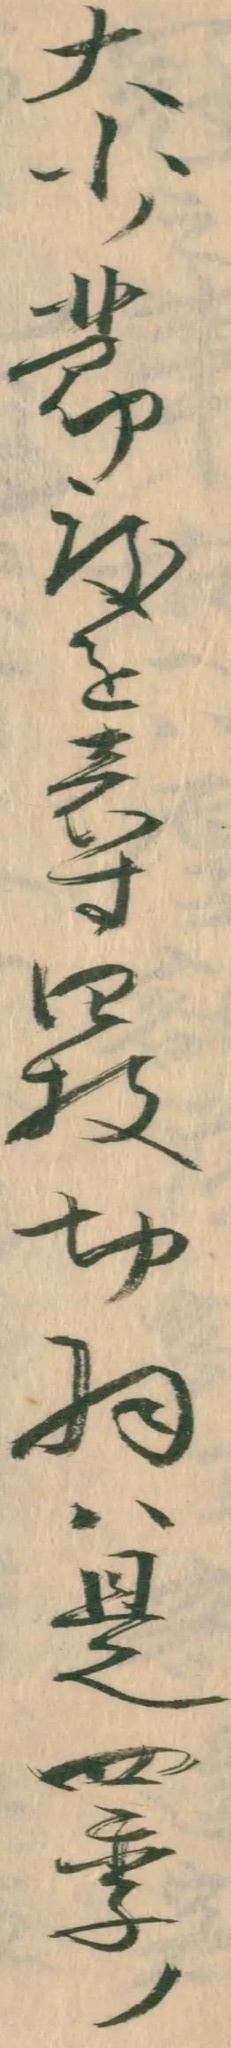大小の節度を表す四枚切物は是四季の
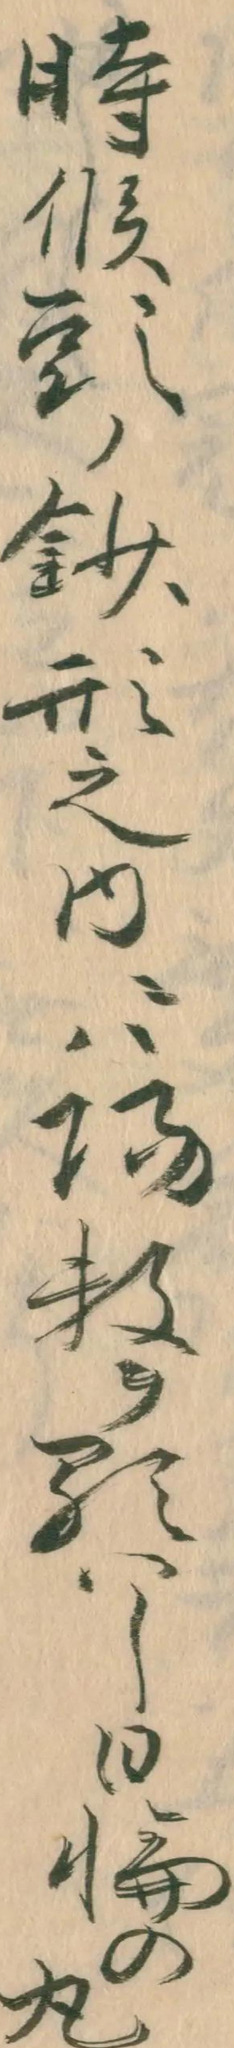時候頭の鈔形之内には陽数を顕はし日輪の丸
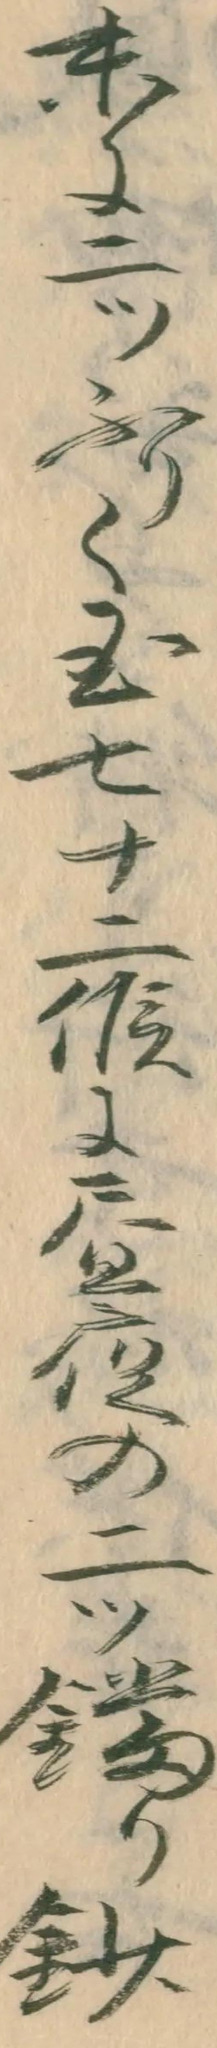末に二つふりく至七十二候に昼夜の二つ鐺り鈔
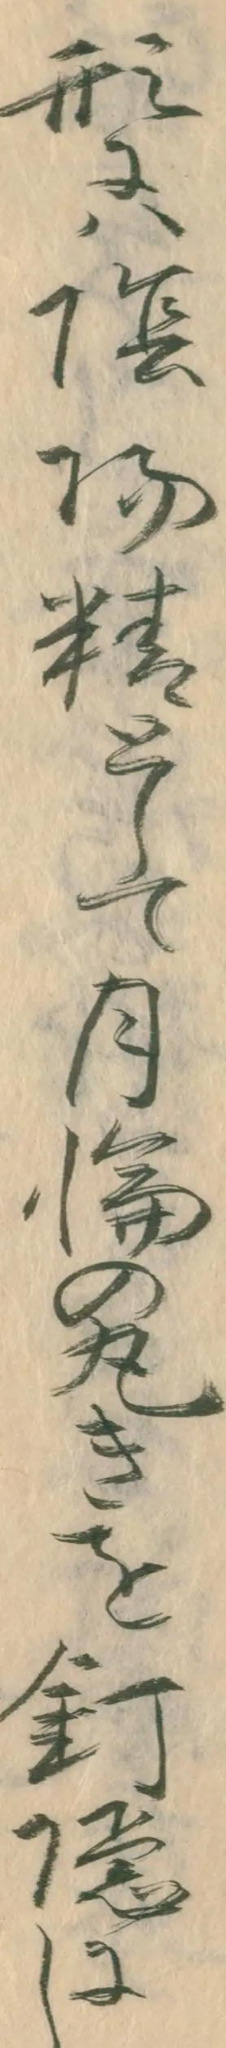形には陰陽精として月輪の丸きを釘隠にし
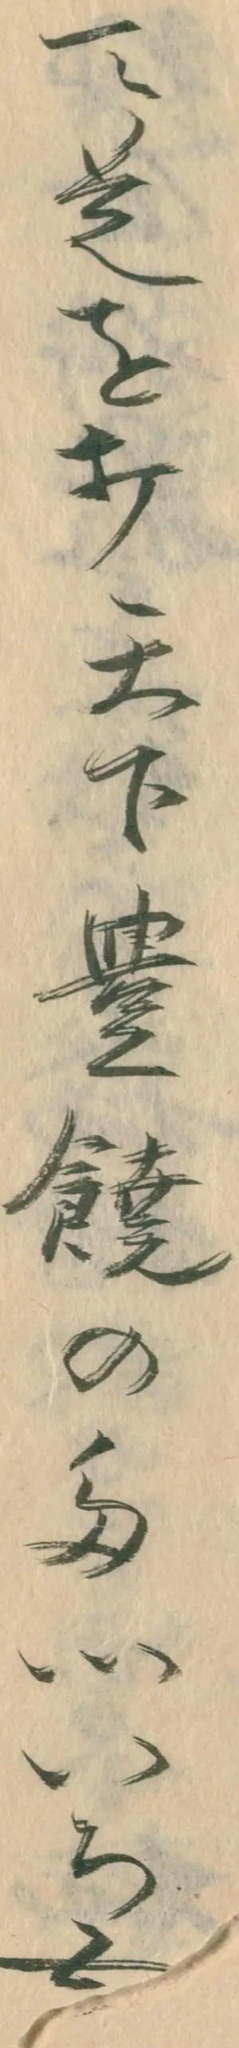て是を打天下豊饒のたいち五
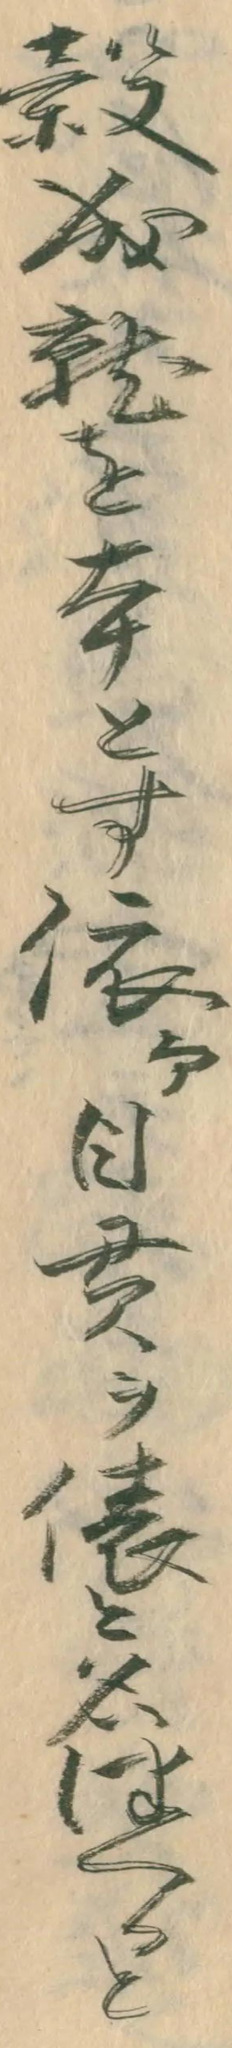穀成就を本とす依而目貫を俵と名つくると

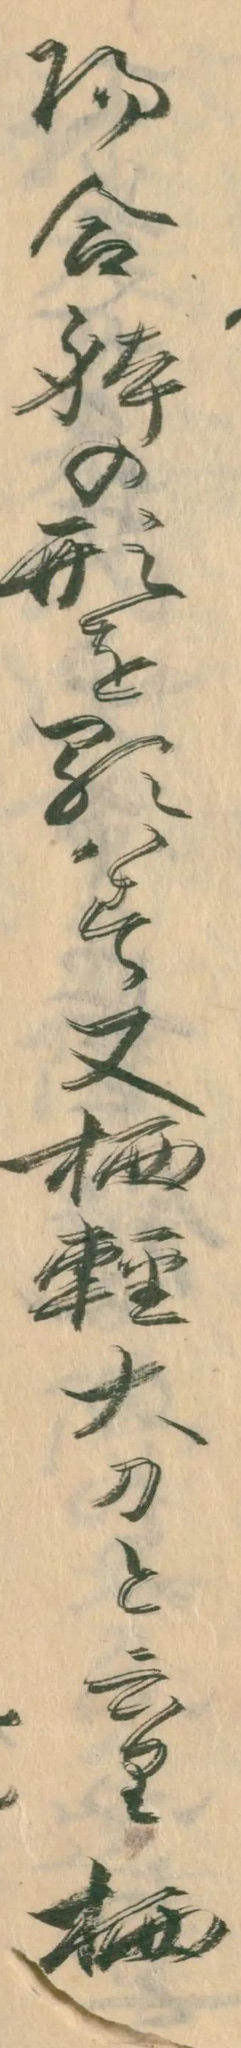陽合体の形を顕はす又栖軽大刀と云り栖
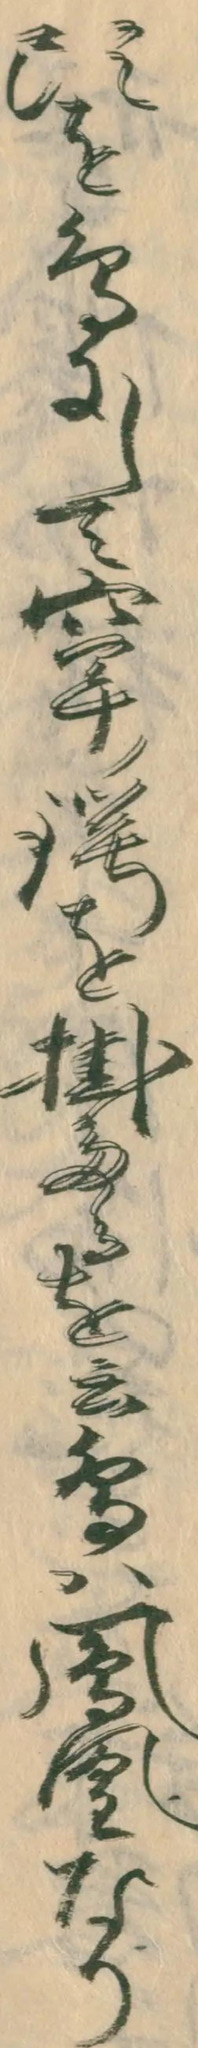頭を鳥にしての鍔を掛たるを云鳥は鳳凰なり
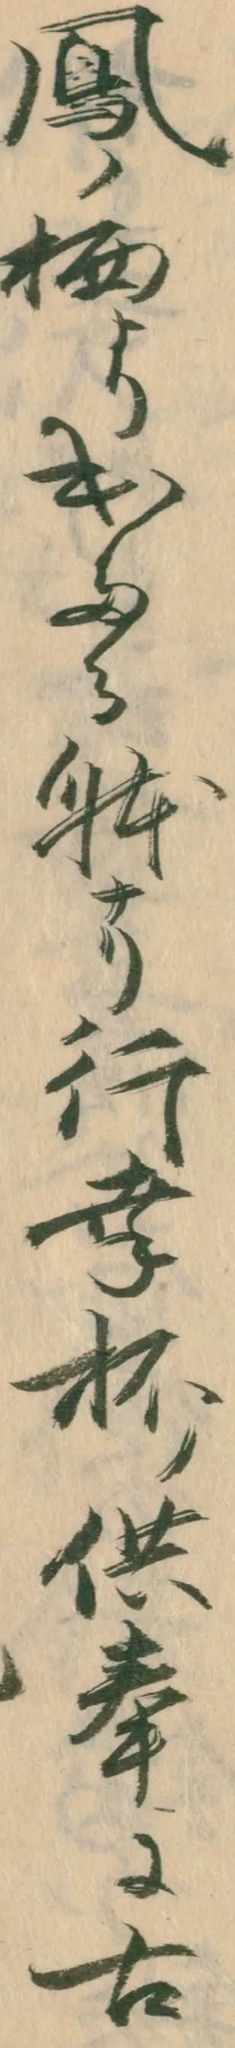鳳の栖より出たる体なり行幸杯の供奉に古
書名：賀茂社記録. 第12冊
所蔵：国立国会図書館 National Diet Library, JAPAN
